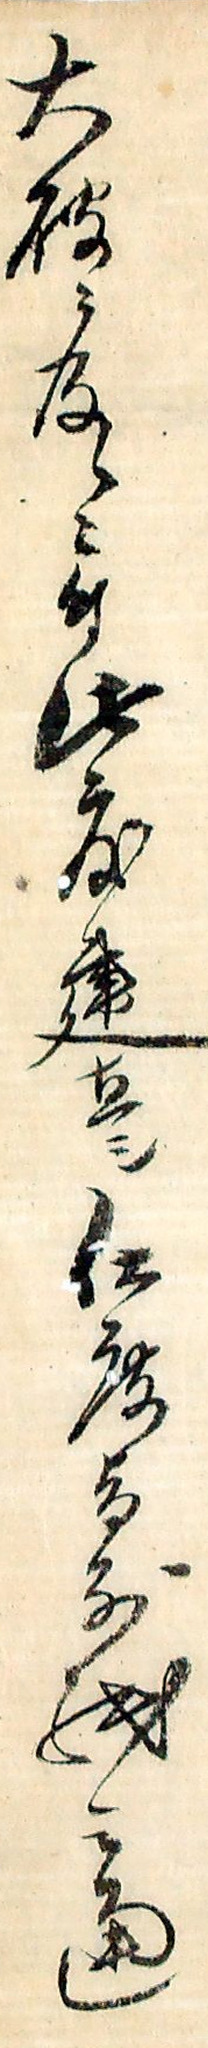大破に及候に付此度建直し仕度旨別紙之通
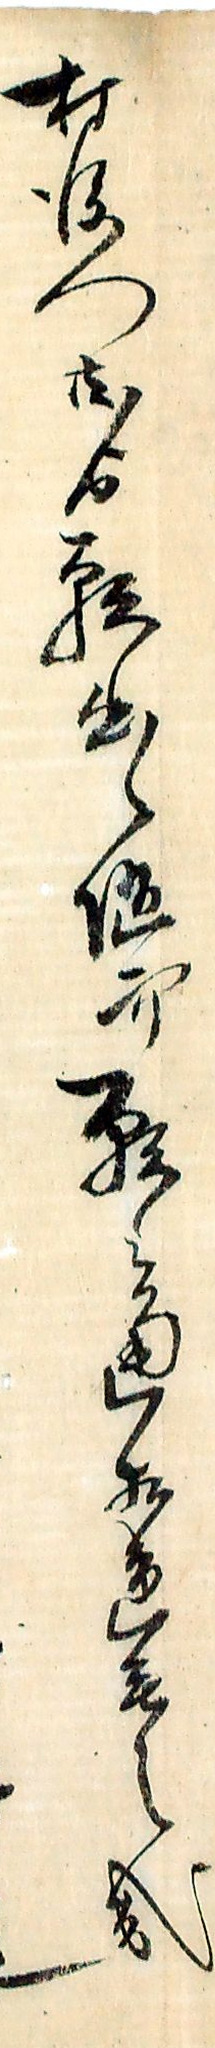村役人共ゟ願出候随て願之通相違無之哉
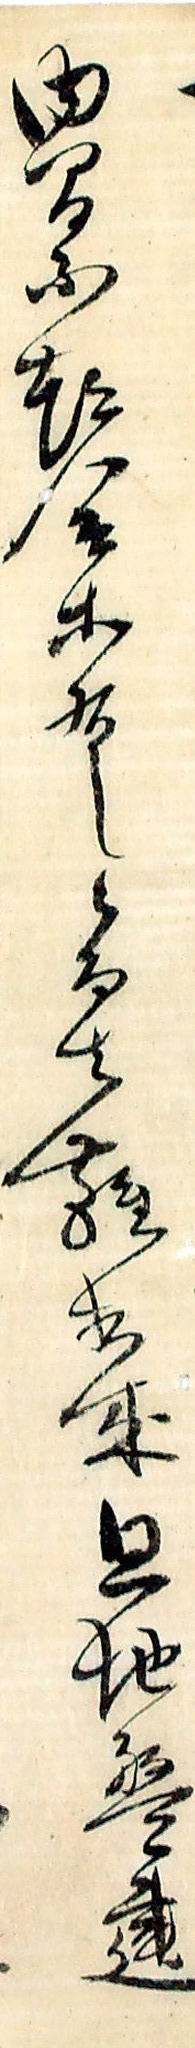内間不都合等有之候ては難出来且地盤建
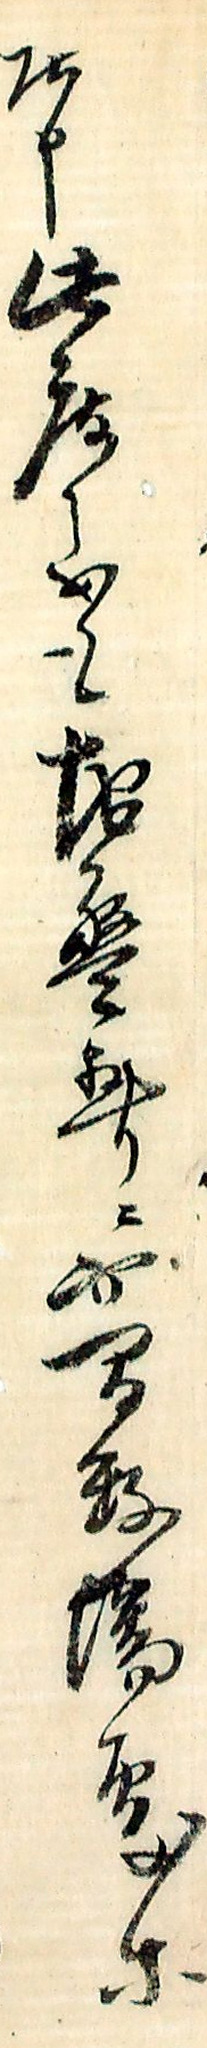居中此度之義も地盤懸りにて間数場処等
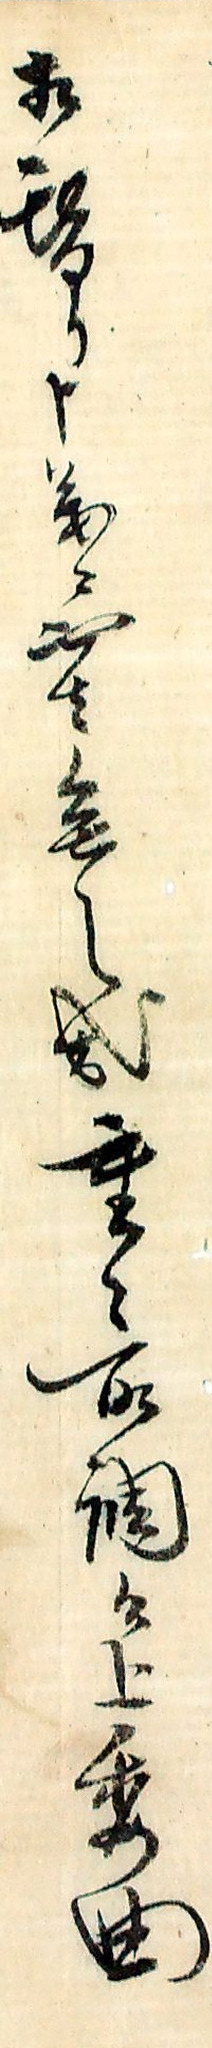相替り申義にては無之哉重々取調候上委曲
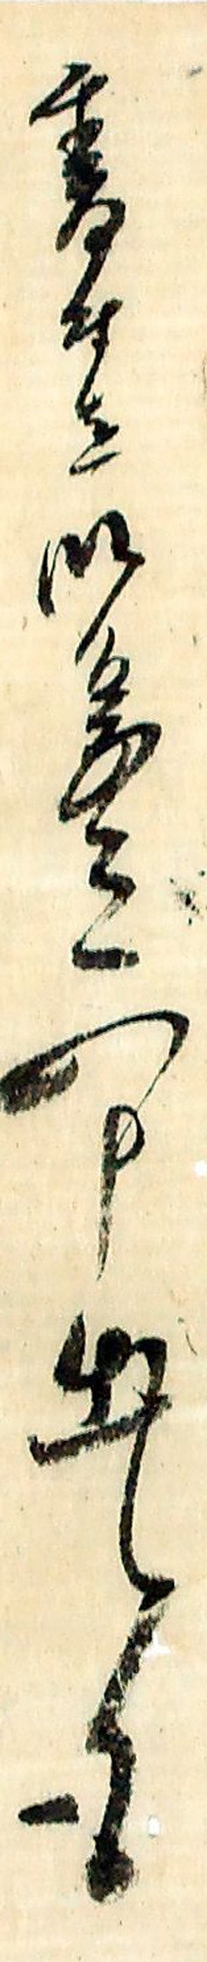書付を以急々可申出候以上
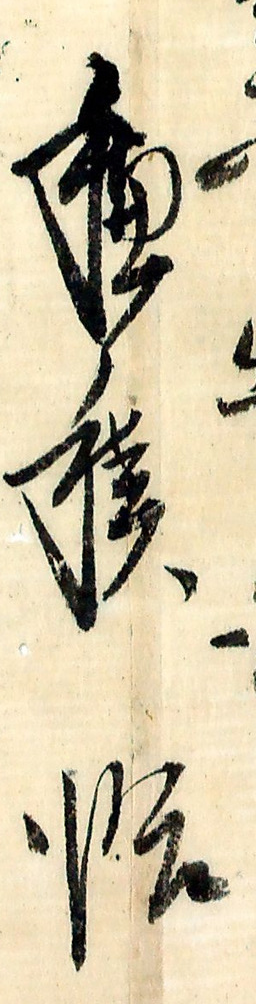穂積恪
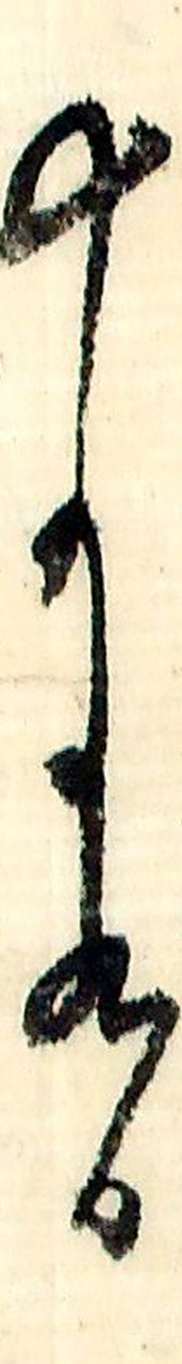十月九日
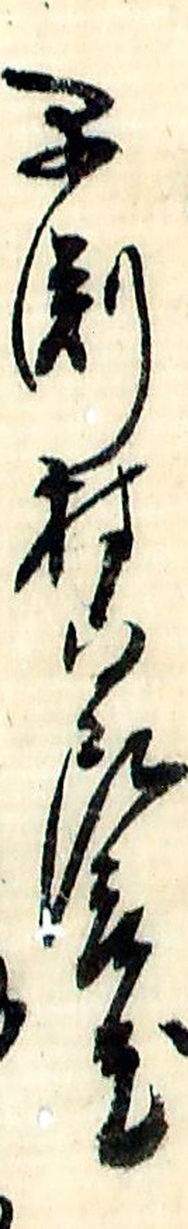早淵村与頭庄屋
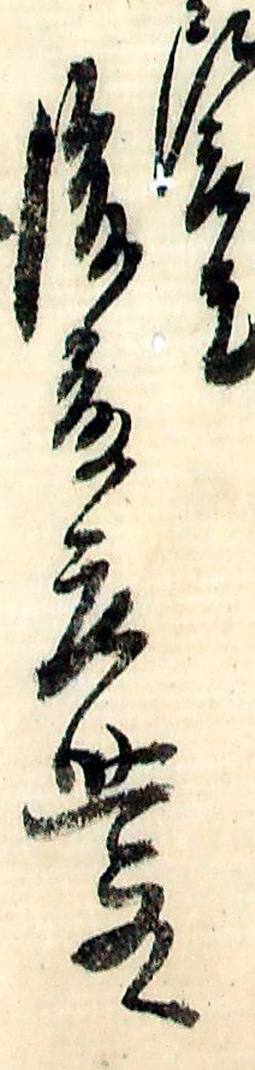後藤庄助とのへ
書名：和田村常夜燈建直行着添書控
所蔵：鳴門教育大学 Naruto University of Education
